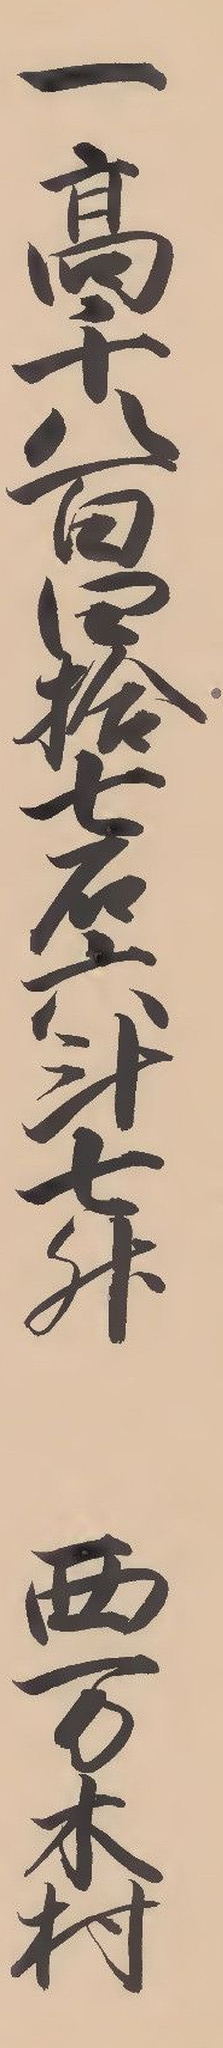一高千八百四拾七石六斗七升西万木村
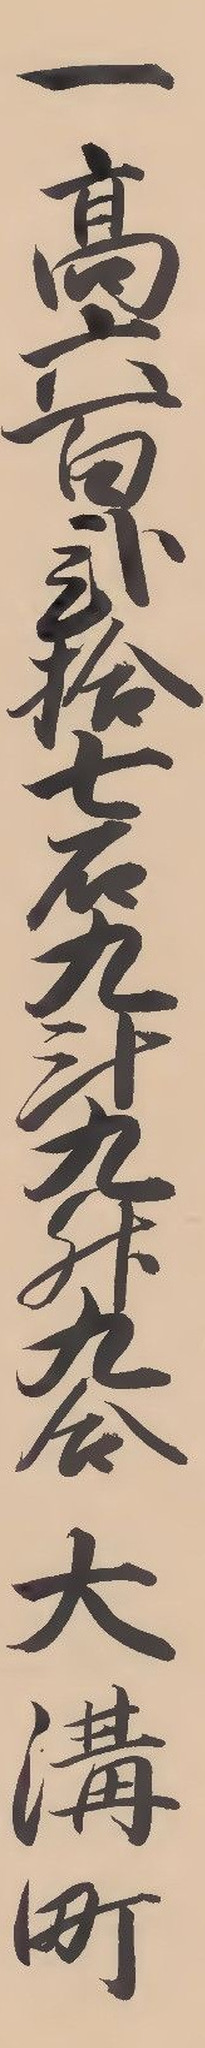一高六百弐拾七石九斗九升九合大溝町
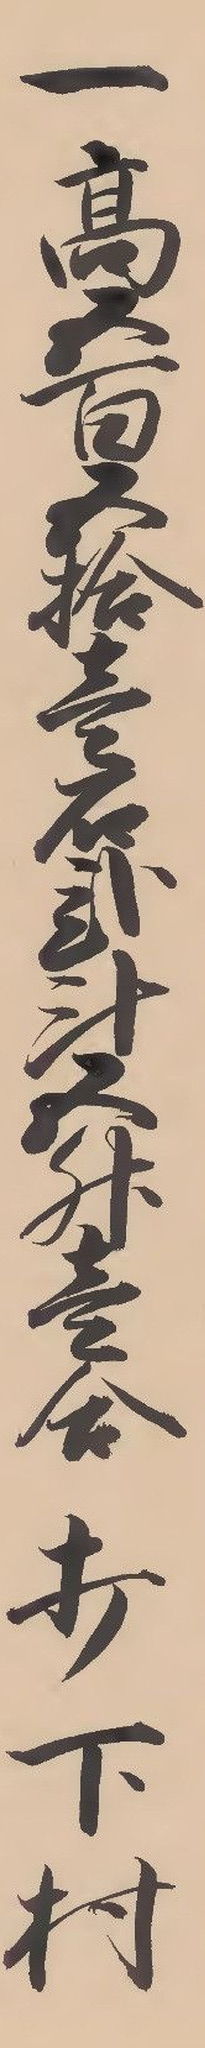一高五百五拾壱石弐斗五升壱合打下村
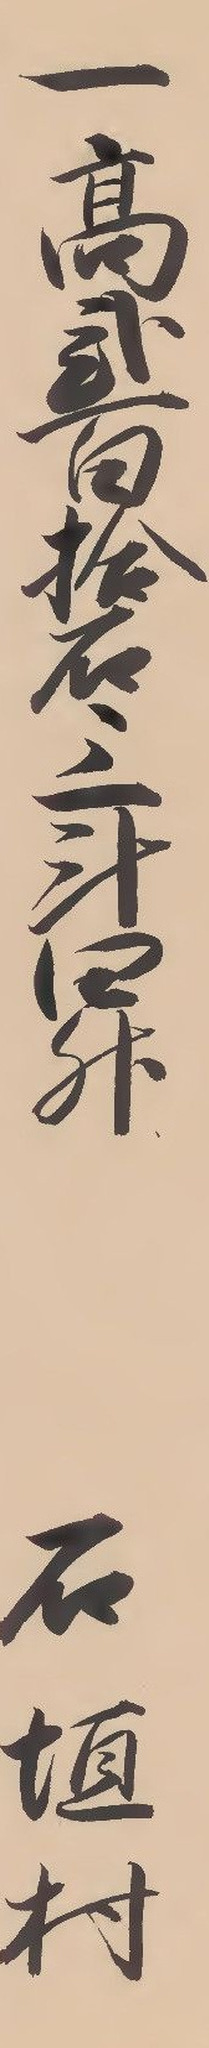一高弐百拾石三斗四升石垣村
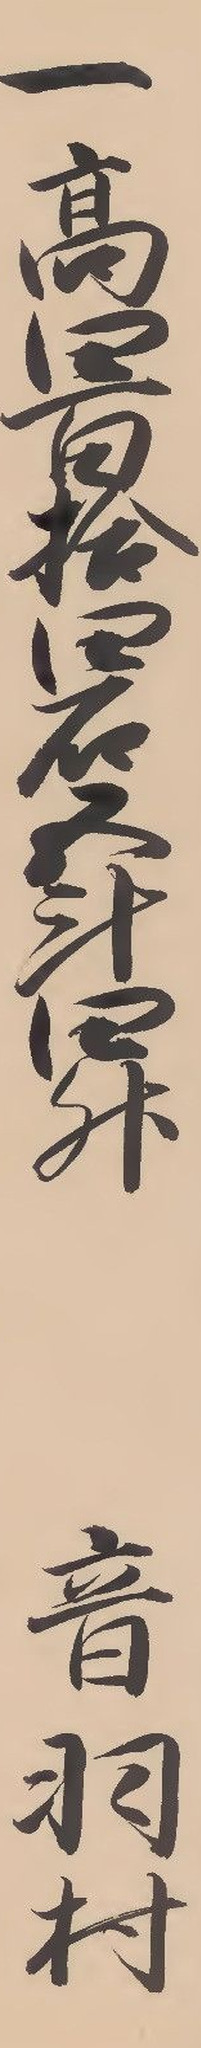一高四百拾四石五斗四升音羽村
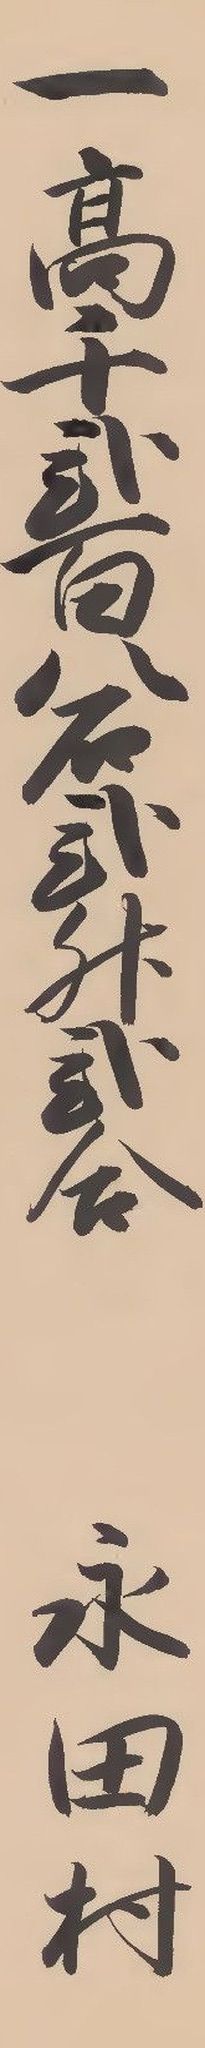一高千弐百八石弐升弐合永田村
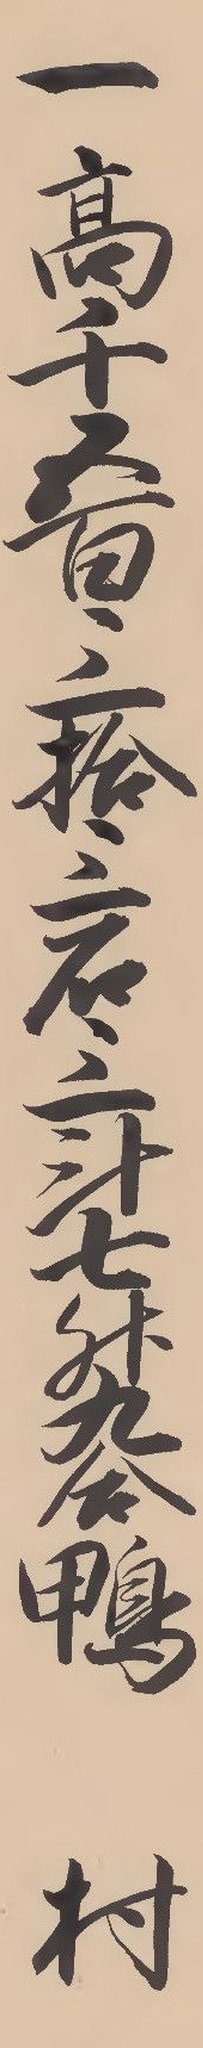一高千五百三拾三石三斗七升九合鴨村

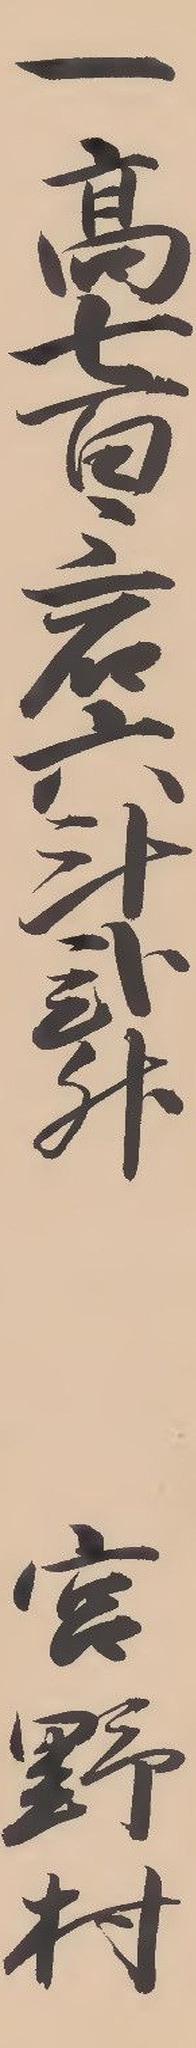一高七百三石六斗弐升宮野村
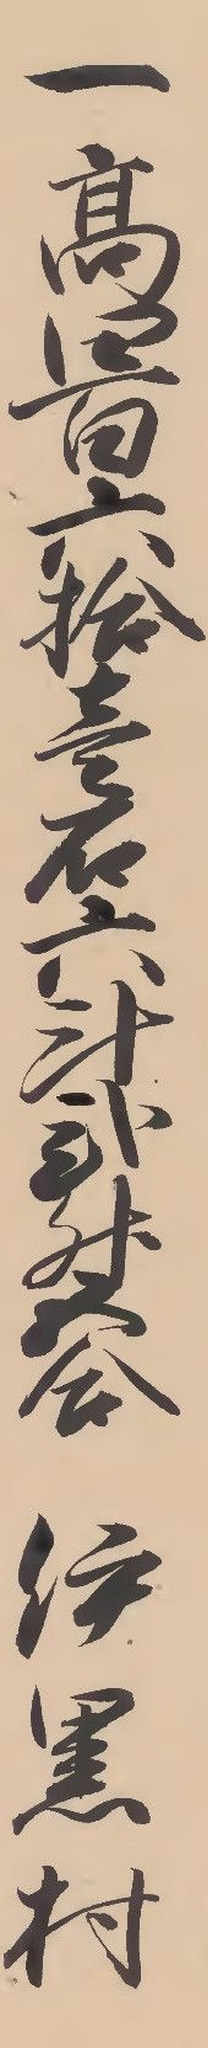一高四百六拾壱石六斗弐升五合伊黒村
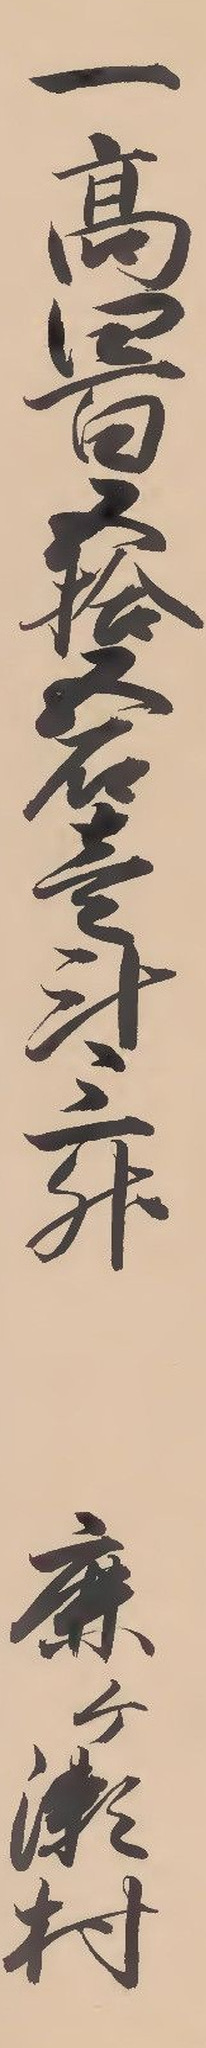一高四百五拾五石壱斗三升鹿ケ瀬村
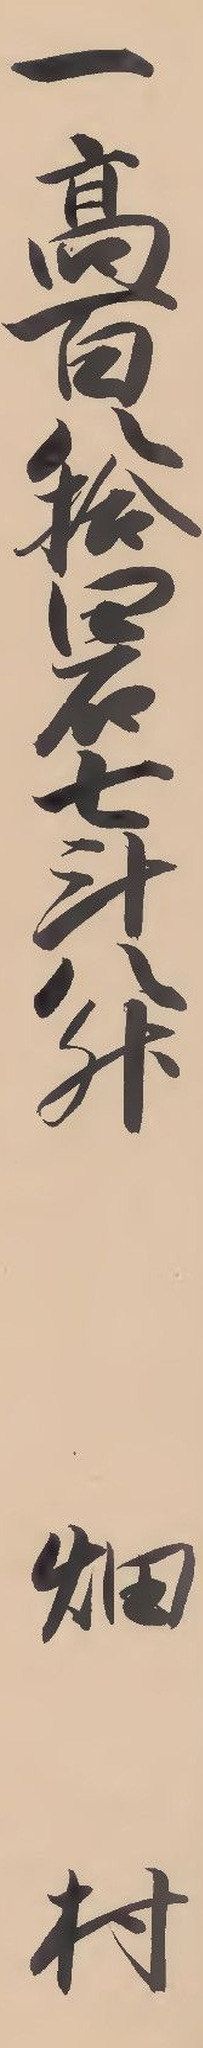一高百八拾四石七斗八升畑村
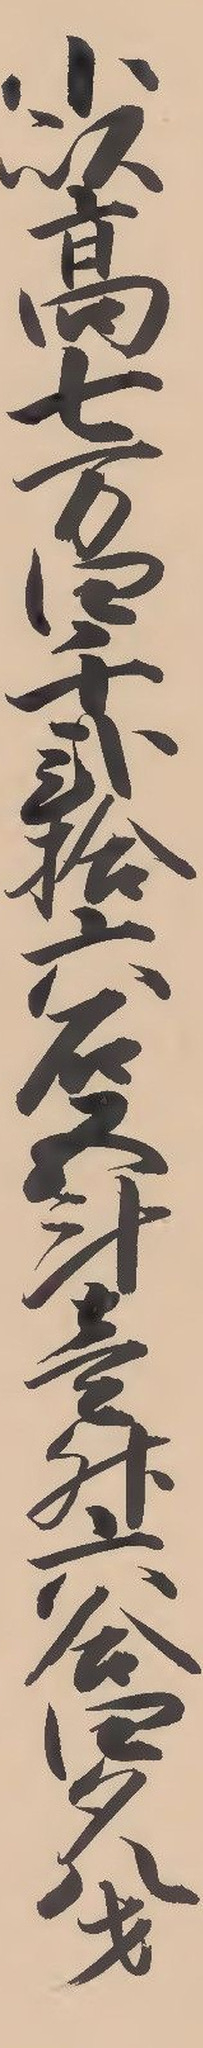小以高七万四千弐拾六石五斗壱升六合四勺八才

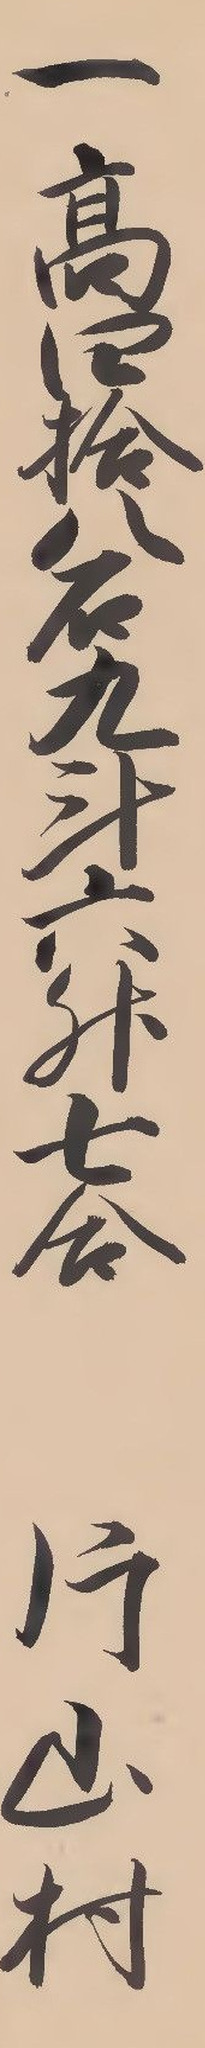一高四拾八石九斗六升七合片山村
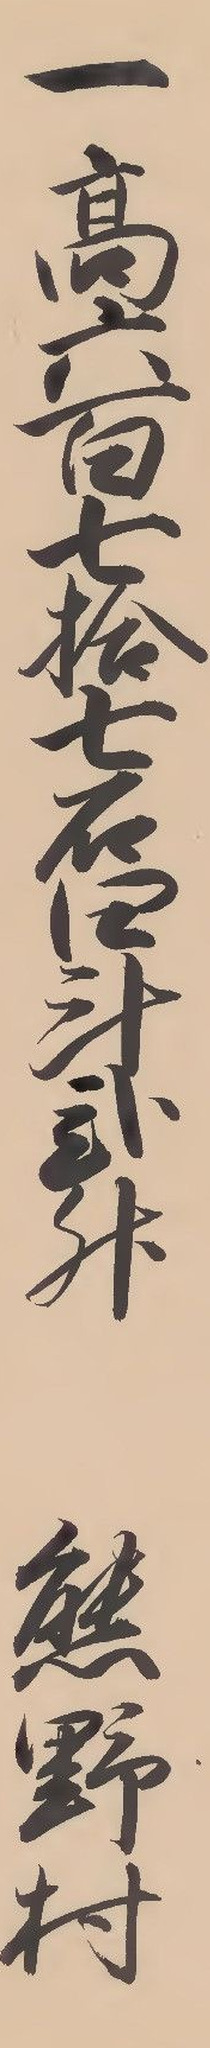一高六百七拾七石四斗弐升熊野村
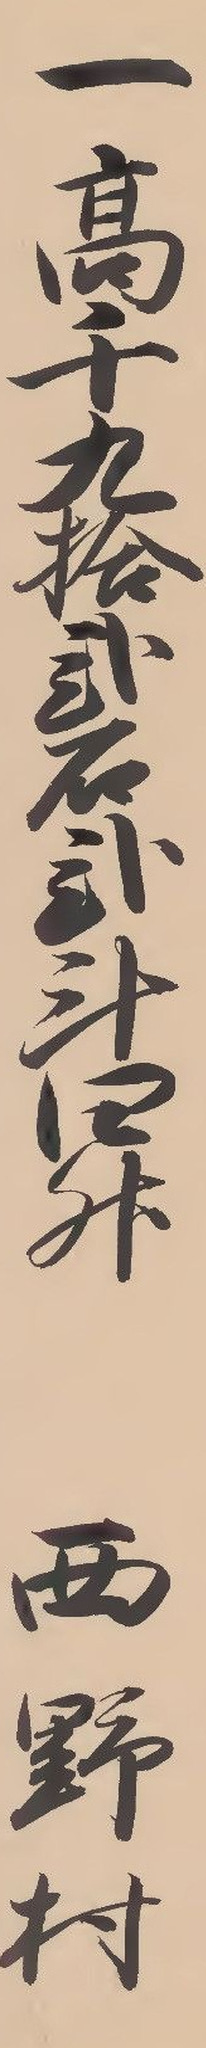一高千九拾弐石弐斗四升西野村
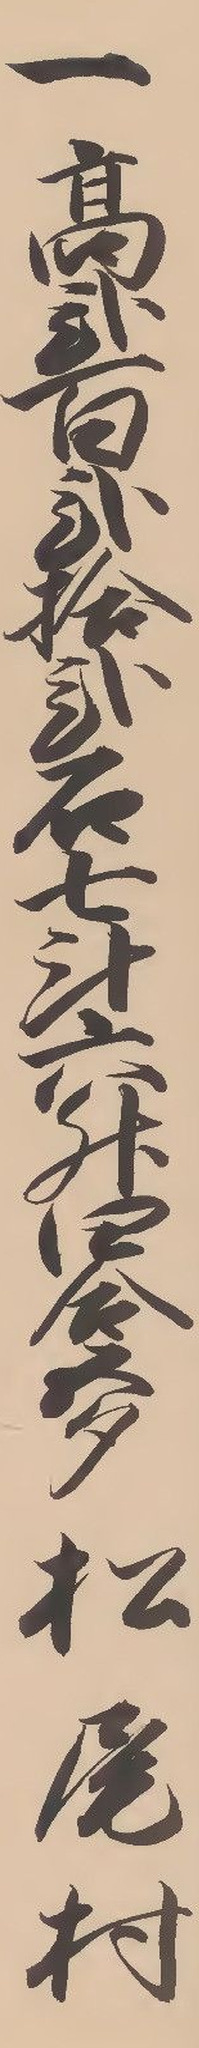一高弐百弐拾弐石七斗六升四合五勺松尾村
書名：近江国郷帳
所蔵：国立公文書館 National Archives of Japan
